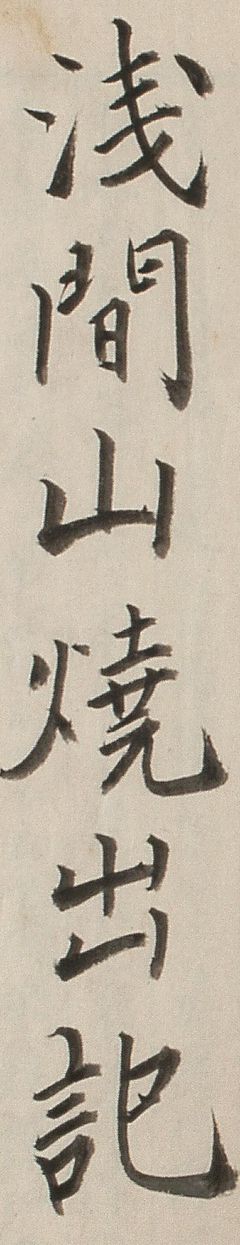浅間山焼出記

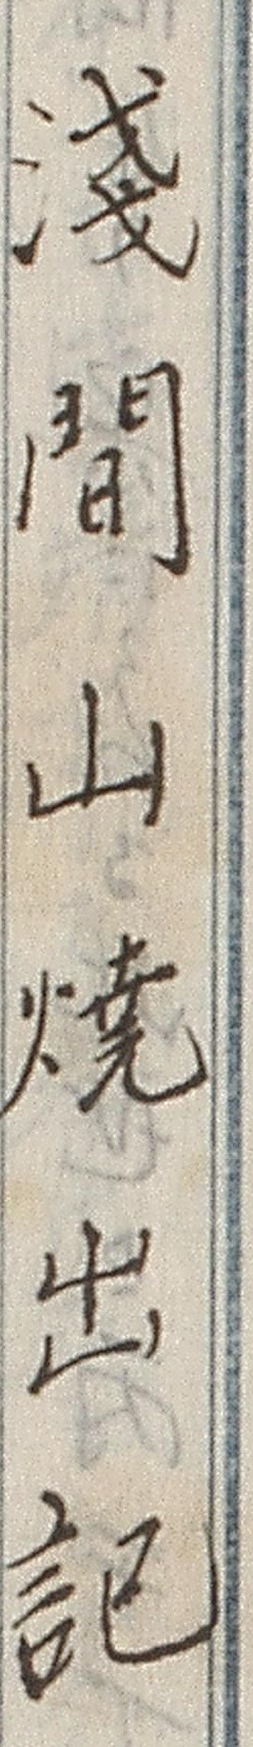浅間山焼出記
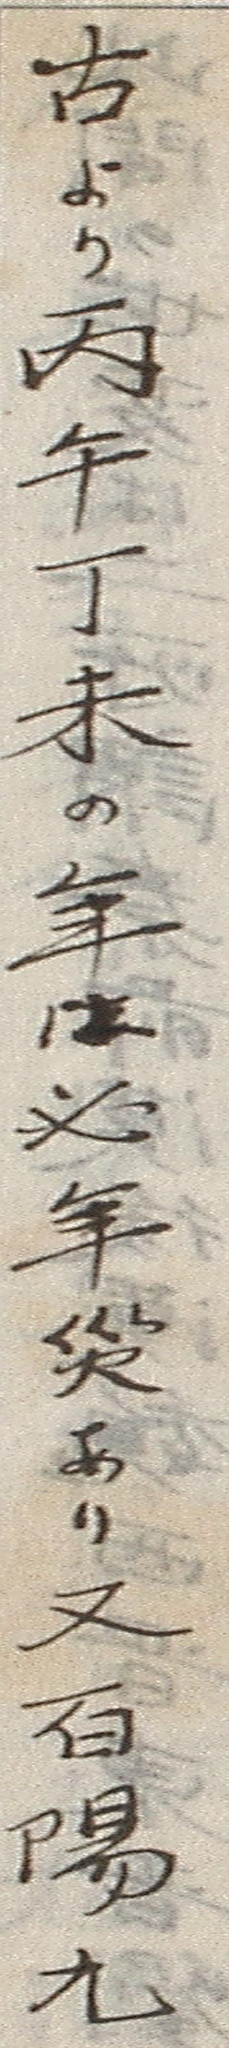古より丙午丁未の年は必ず年災あり又百陽九
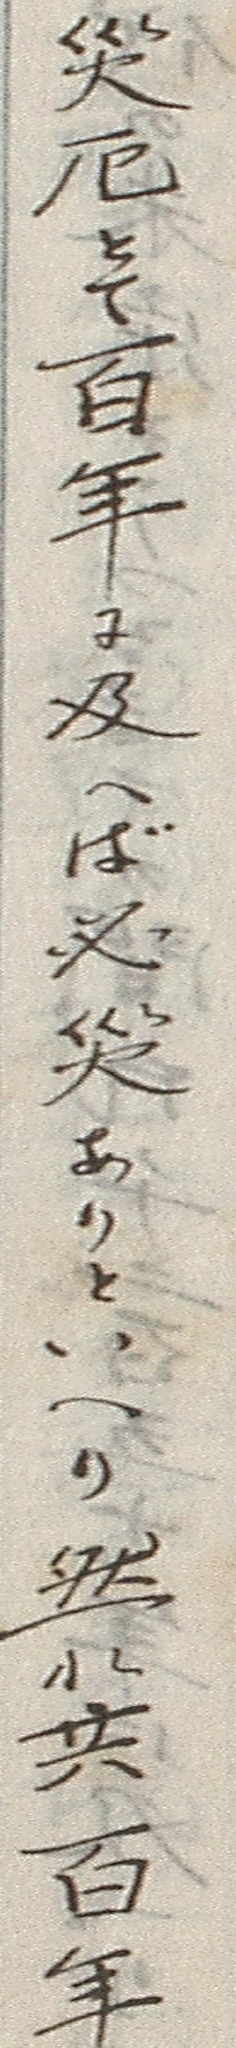災厄とて百年に及へば必災ありといへり然れ共百年
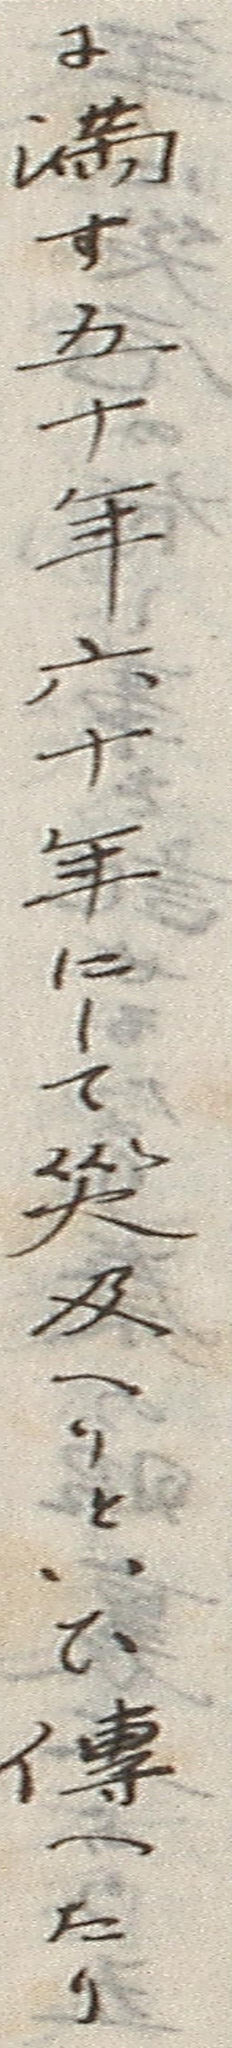に満す五十年六十年にして災及へりといひ傳へたり
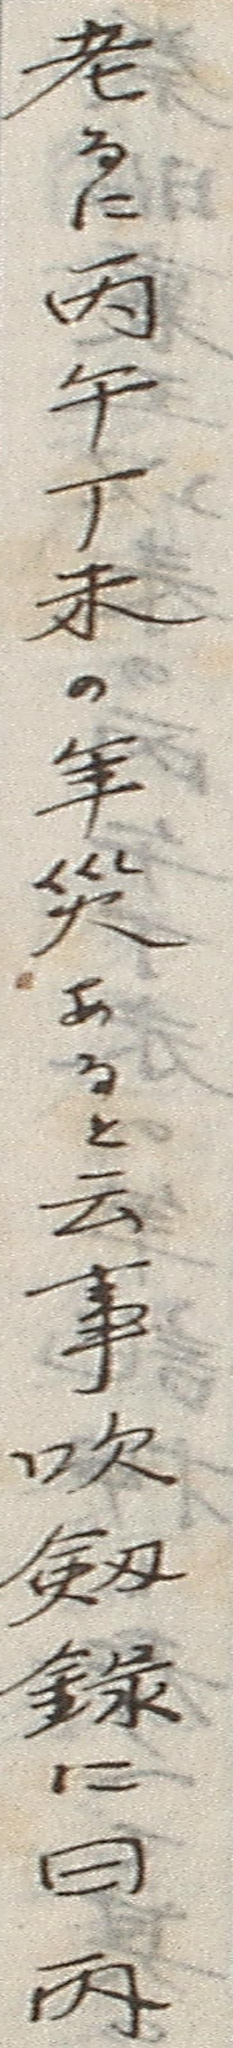老るに丙午丁未の年災あると云事吹剣録に曰丙
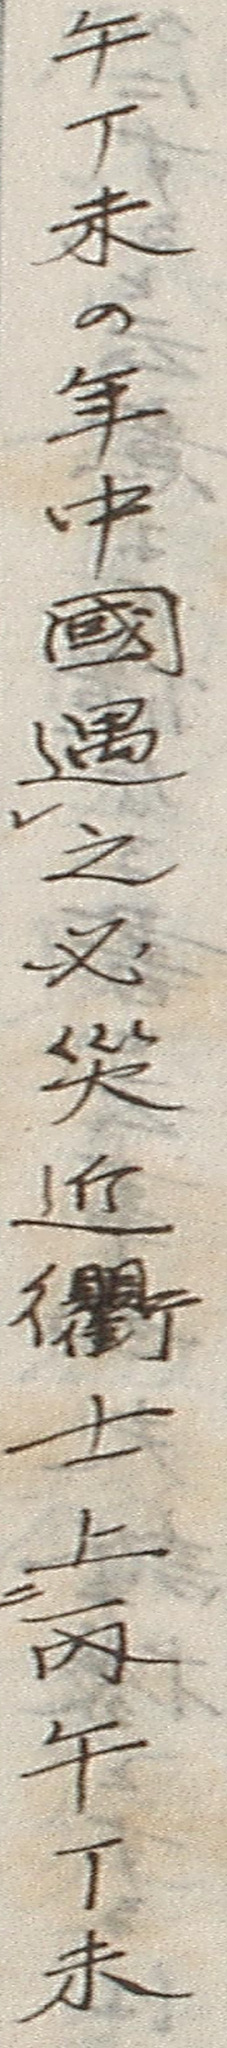午丁未の年中國遇之必災近衢士上丙午丁未
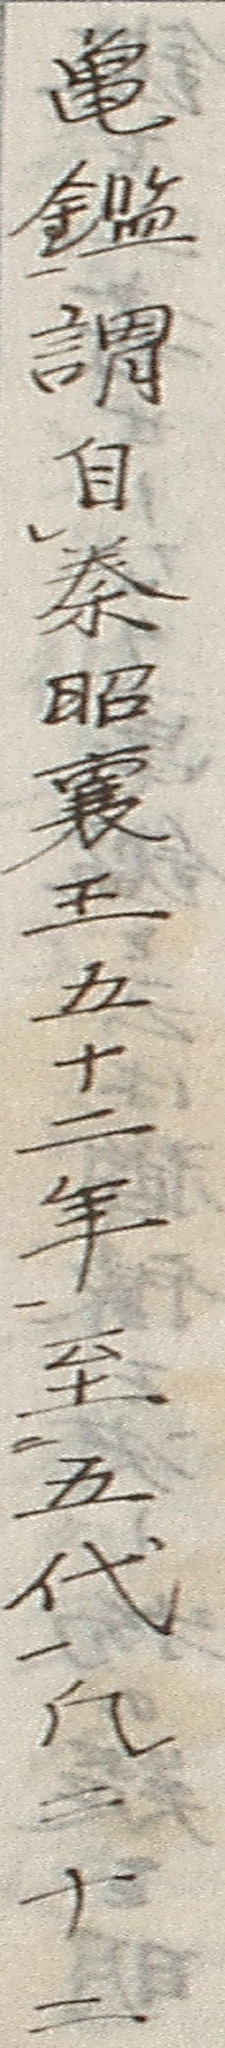亀鑑謂自泰昭襄王五十二年至五代凡二十二
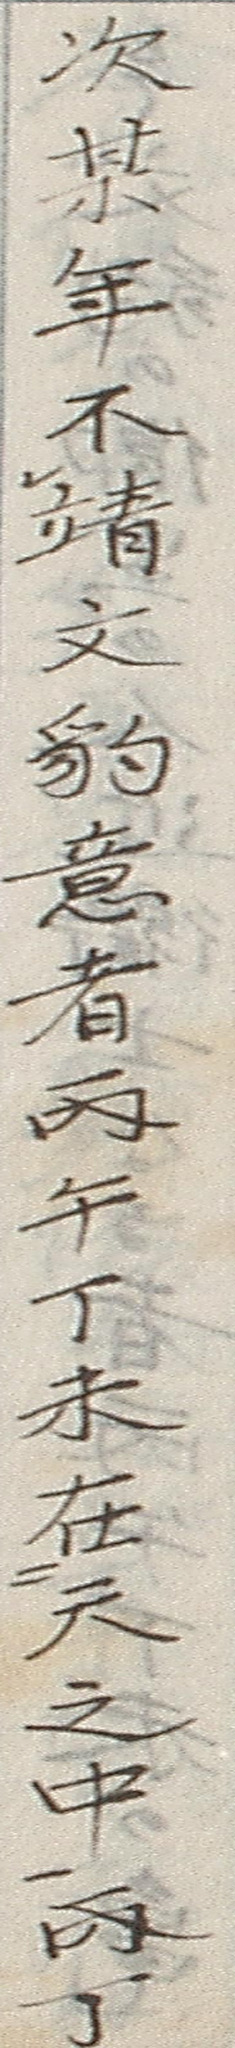次某年不靖文豹意者丙午丁未在天之中丙丁
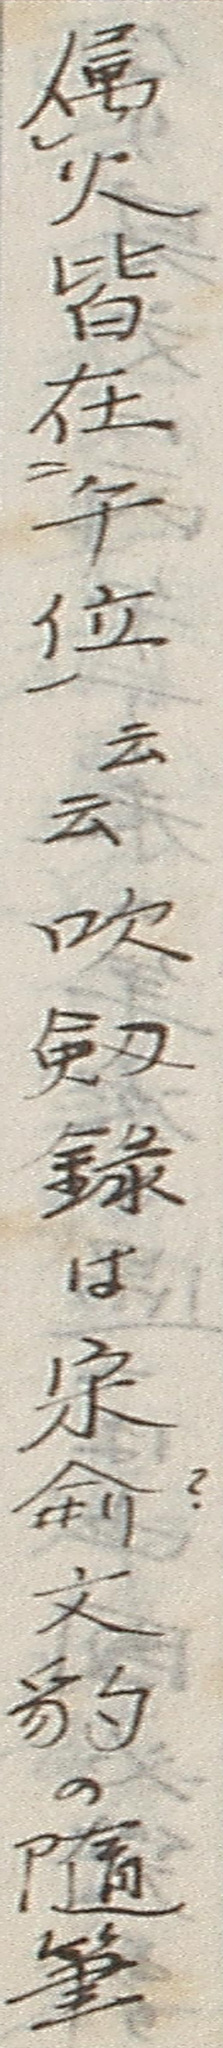属火皆在午位云云吹剣録は宋兪文豹の随筆

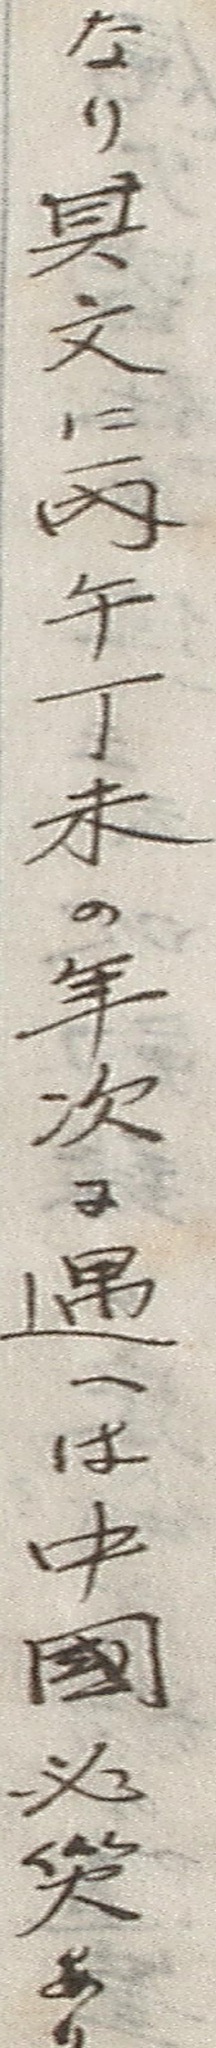なり其文に丙午丁未の年次に遇へは中國必災あり
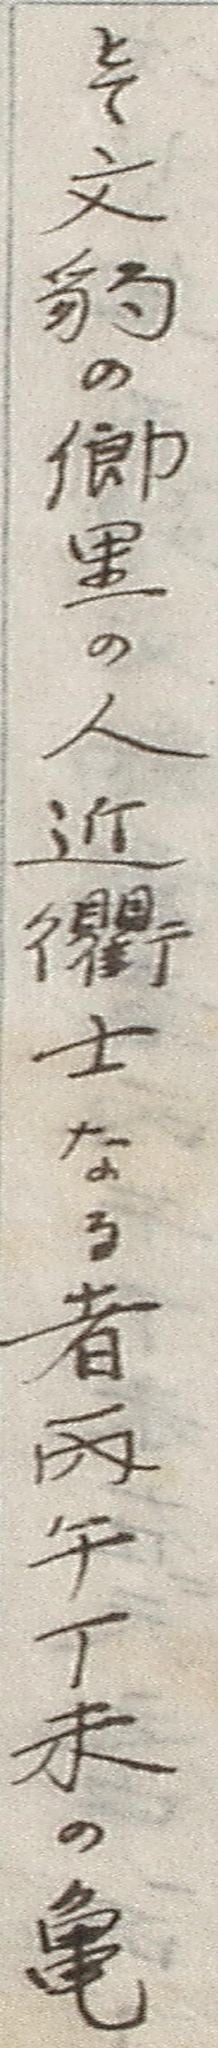とて文豹の郷里の人近衛士なる者丙午丁未の亀
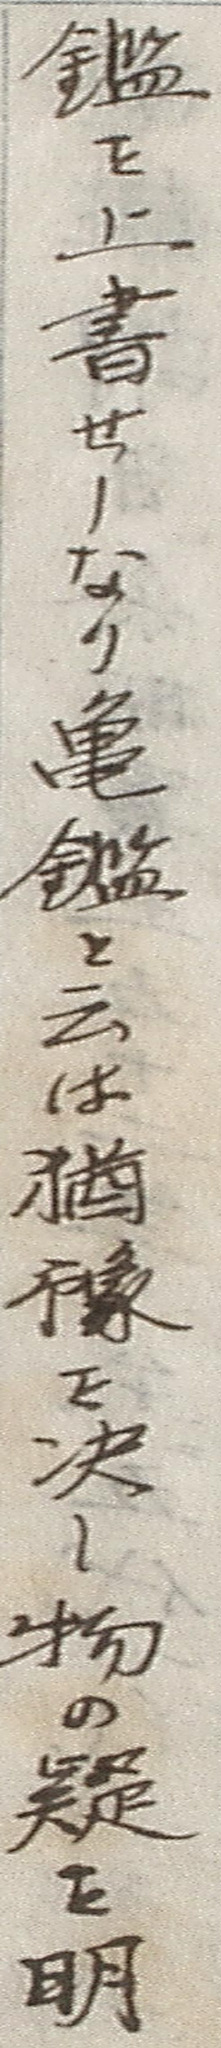鑑を上書せしなり亀鑑と云は猶豫を決し物の疑を明
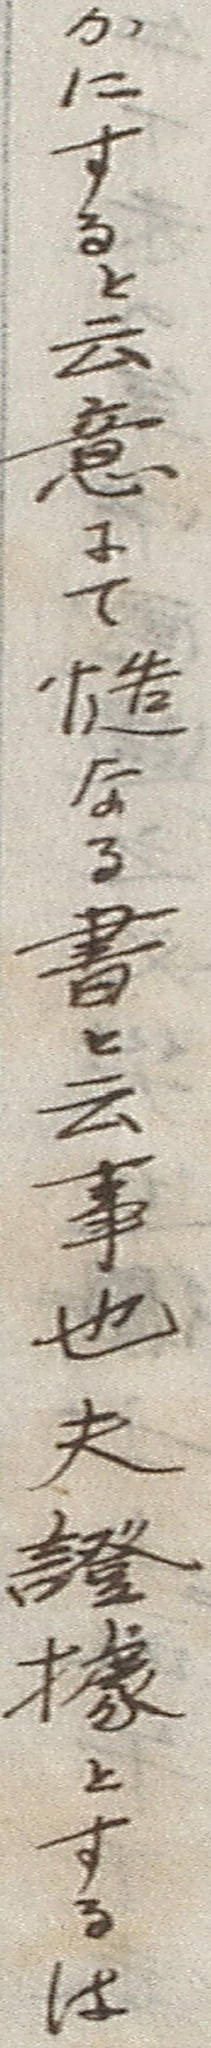かにすると云意にて慥なる書と云事也夫證據とするは
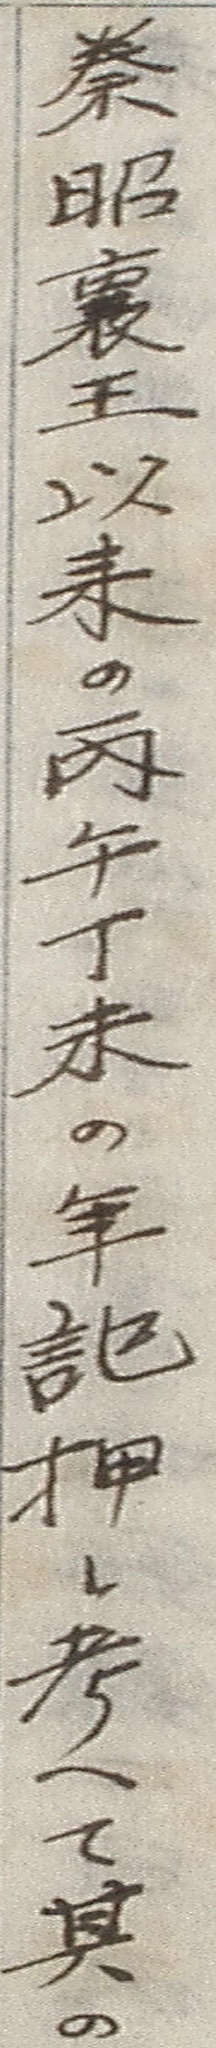秦昭襄王以来の丙午丁未の年記押し考へて其の
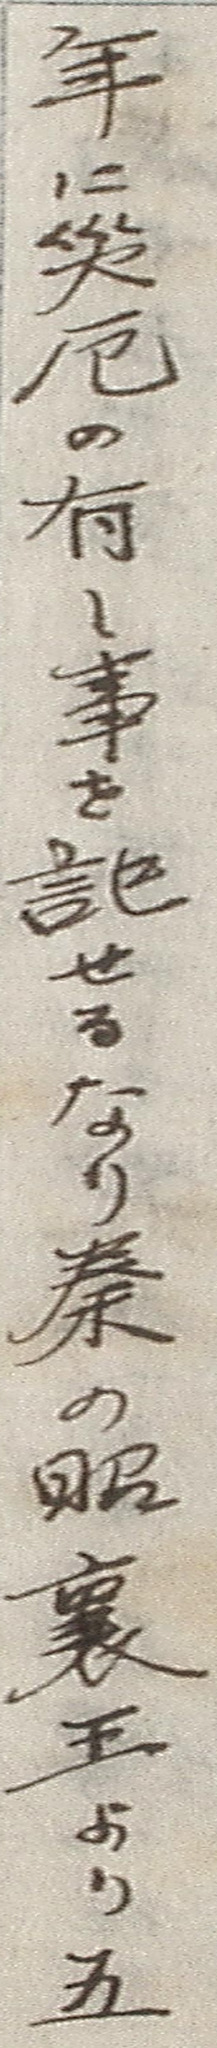年に災厄の有し事を記せるなり秦の昭襄王より五
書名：浅間山焼出記
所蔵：東京大学地震研究所図書室 Earthquake Research Institute Library, The University of Tokyo, JAPAN
